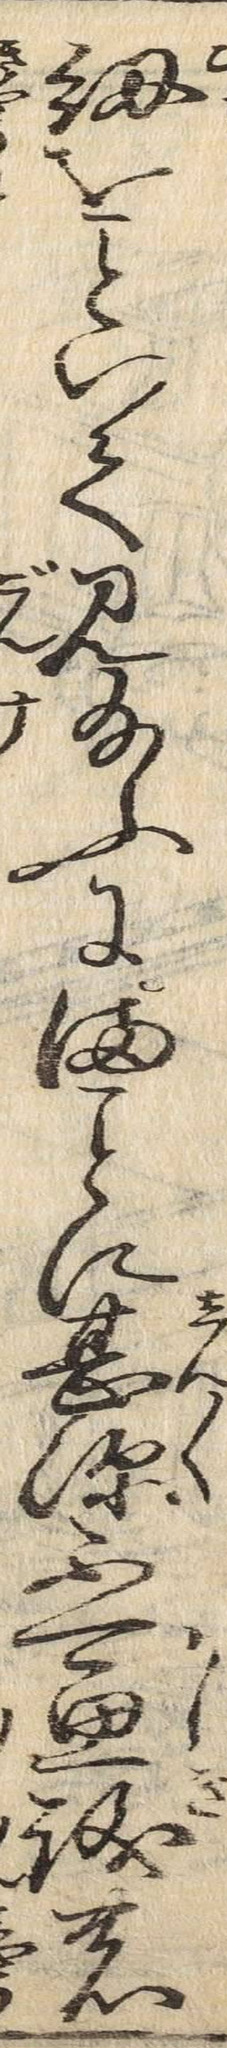紐をといて見給ふに。まことに甚深不可思議の
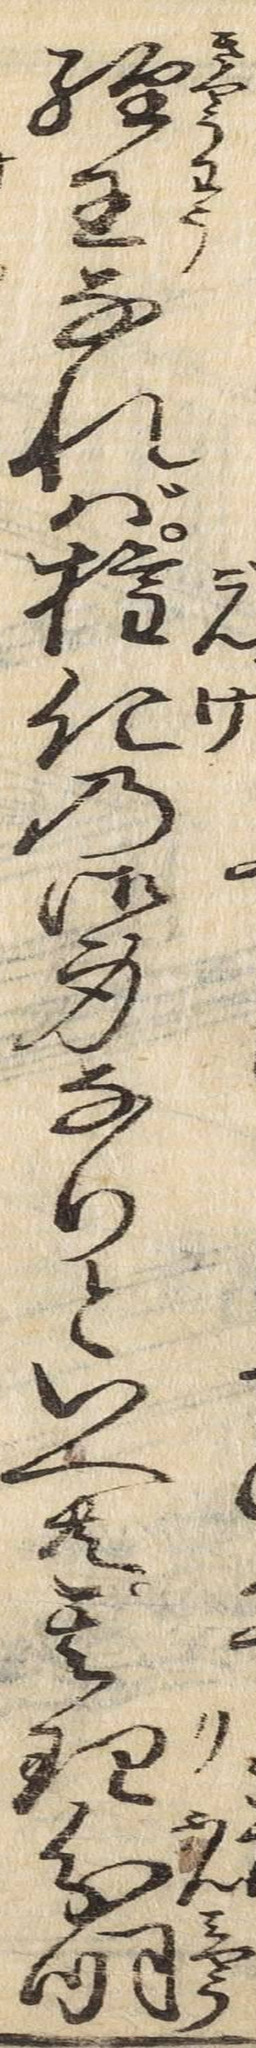経王なれば。権化の御身なりといへ共。其理分明
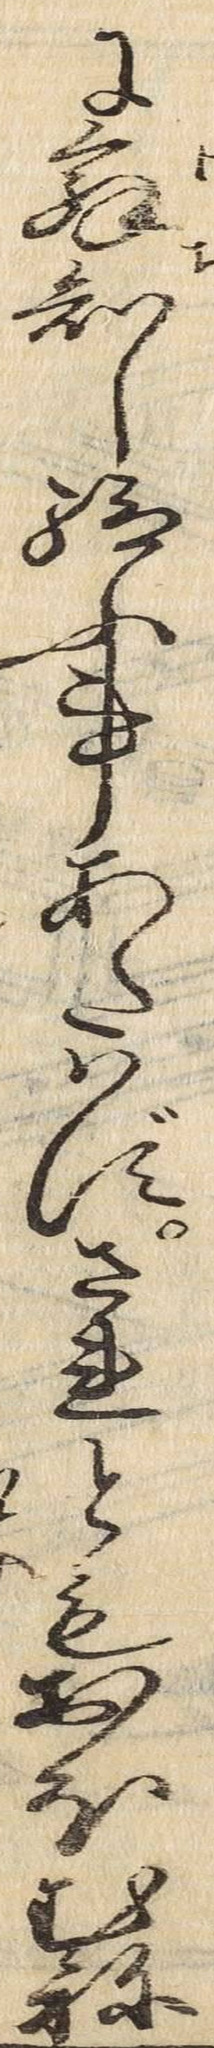に解知し給ふ事あたはず。されともおほむね
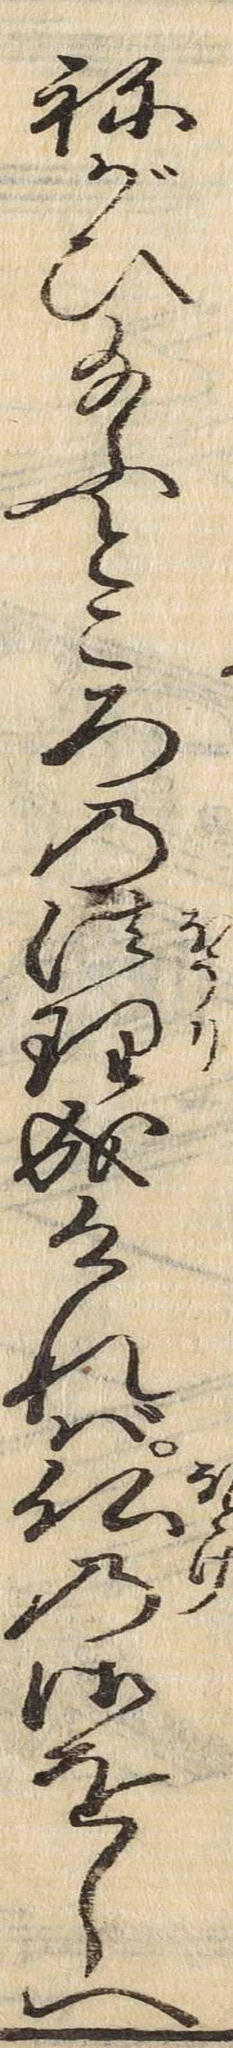ねがひ給ふところの法理成ければ。仏の御をしへ
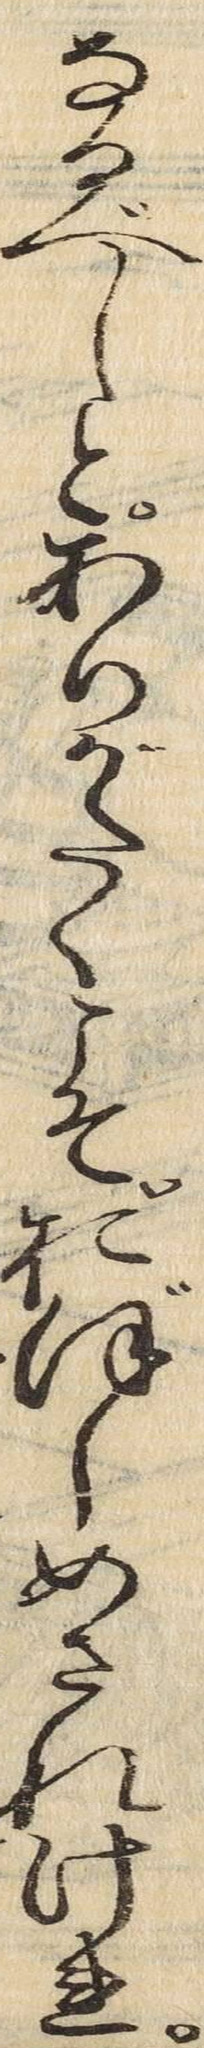なるべしと。ありがたくこそ。おぼしめされけれ。
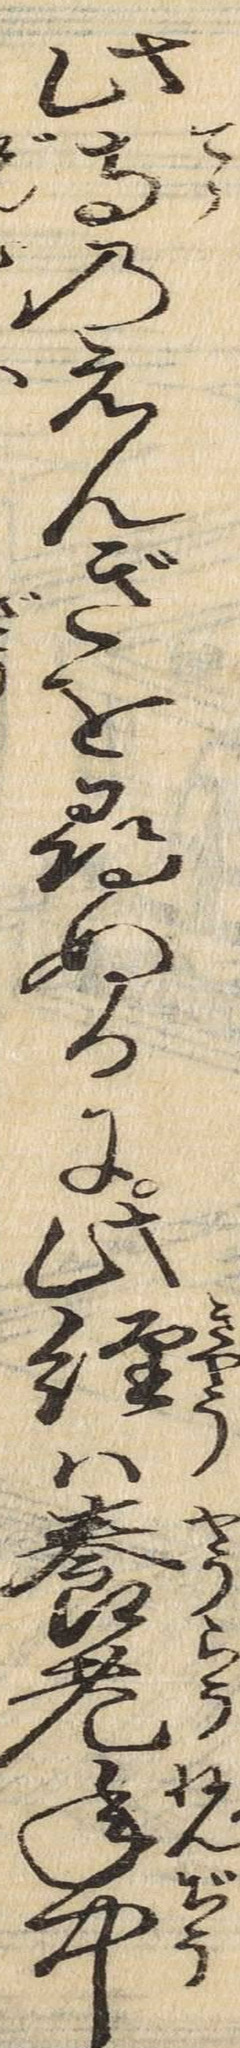此寺のえんぎを尋ぬるに。此経は養老年中
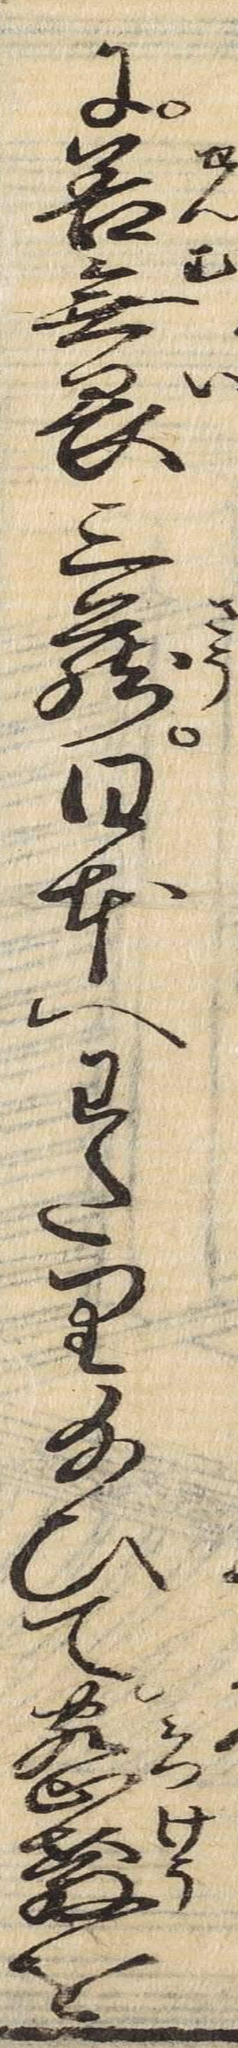に。善無畏三蔵。日本へわたり給ひて。密教を
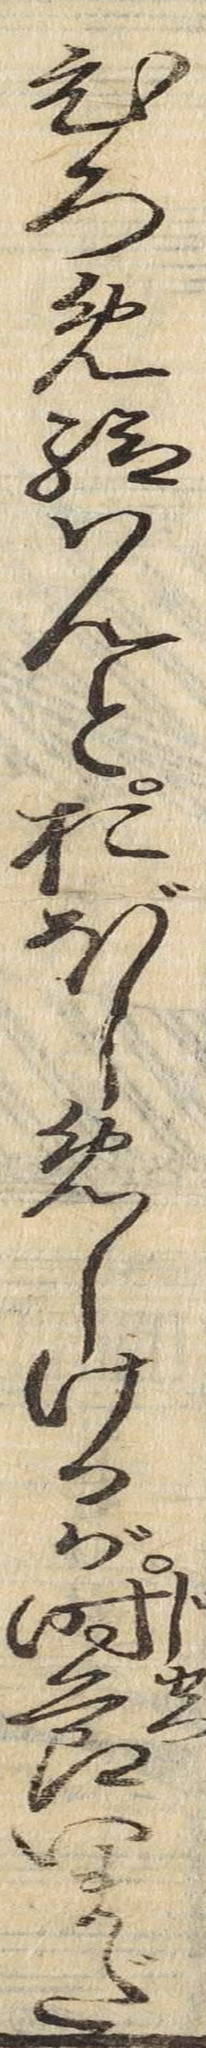ひろめ給はんと。おぼしめしけるが。時節いまだ
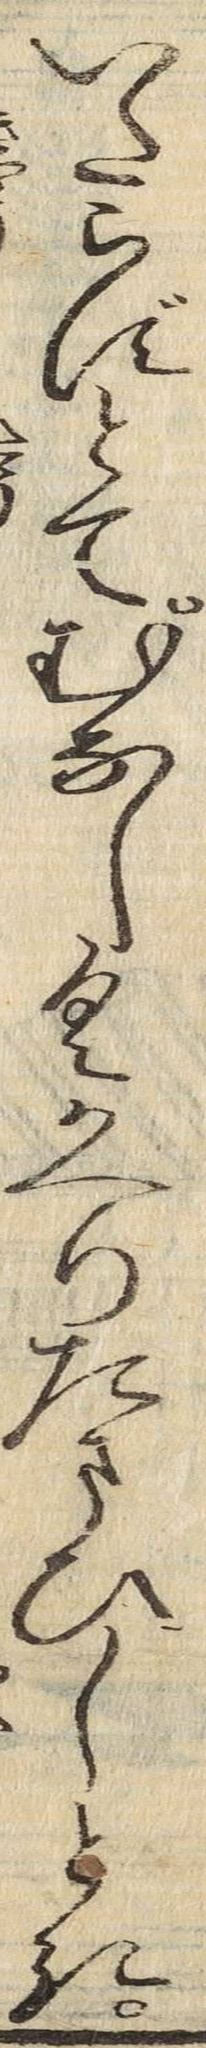いたらずとて。むなしくかへりたまひしとき。
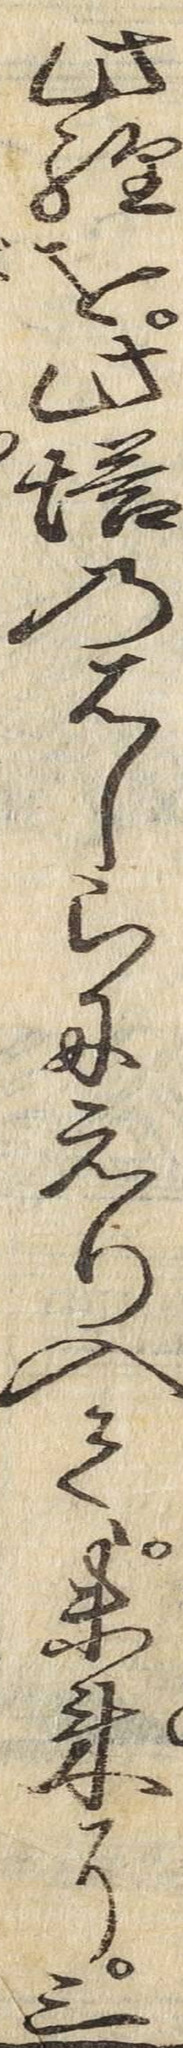此経を。此塔のはしらにえり入て。未来に。三
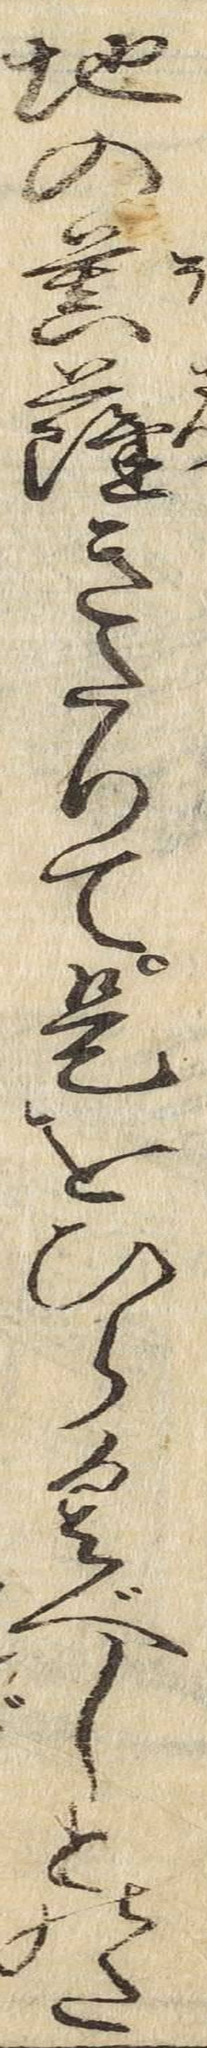地の菩薩きたりて。是をひらくべしとのた
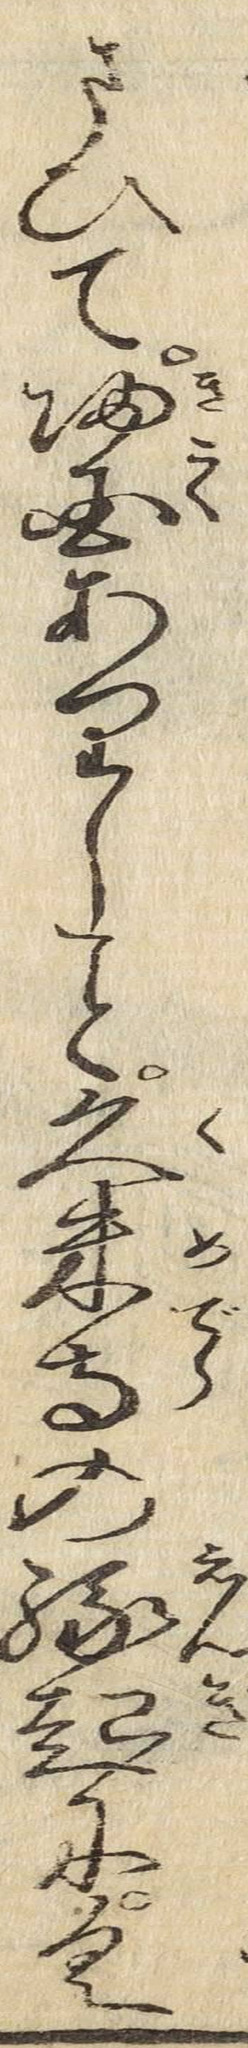まひて。帰国ありしこと。久米寺の縁起に。く
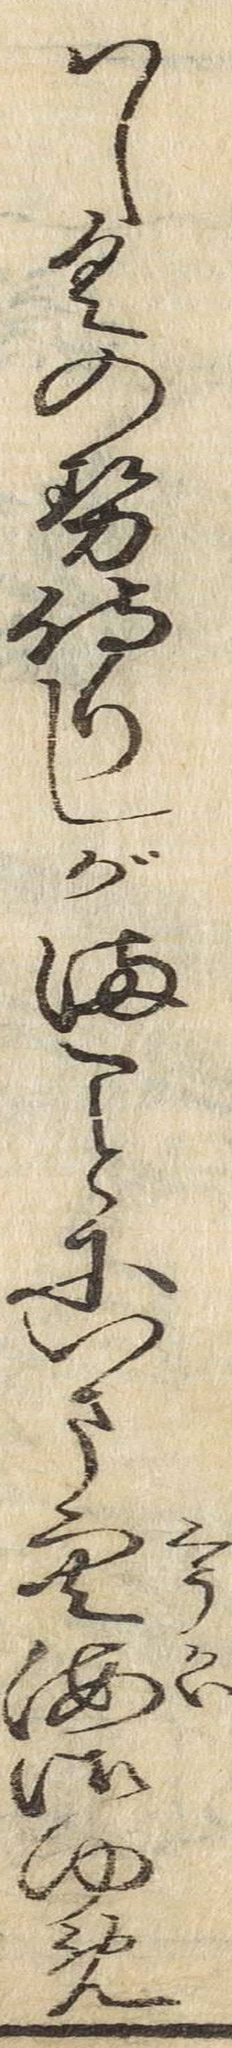はしくのせ侍りしがまことにいま空海御ゆめ
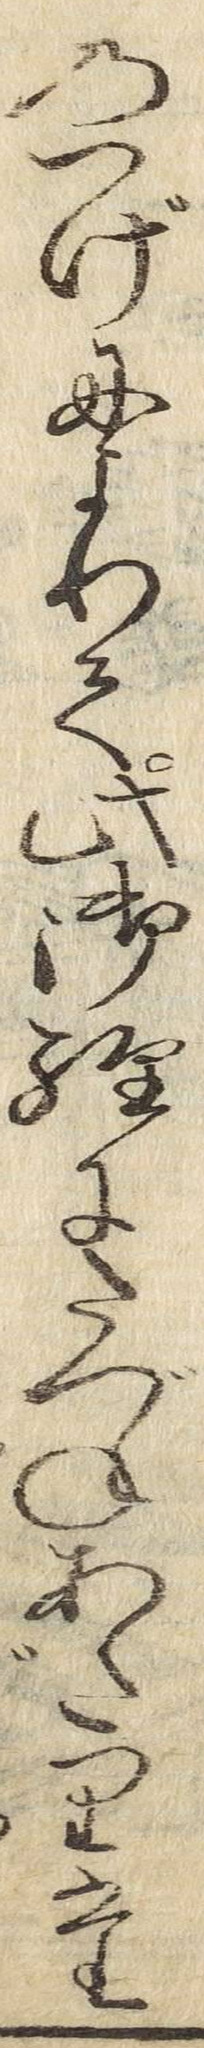のつげによりて。此御経にたづねあたりた
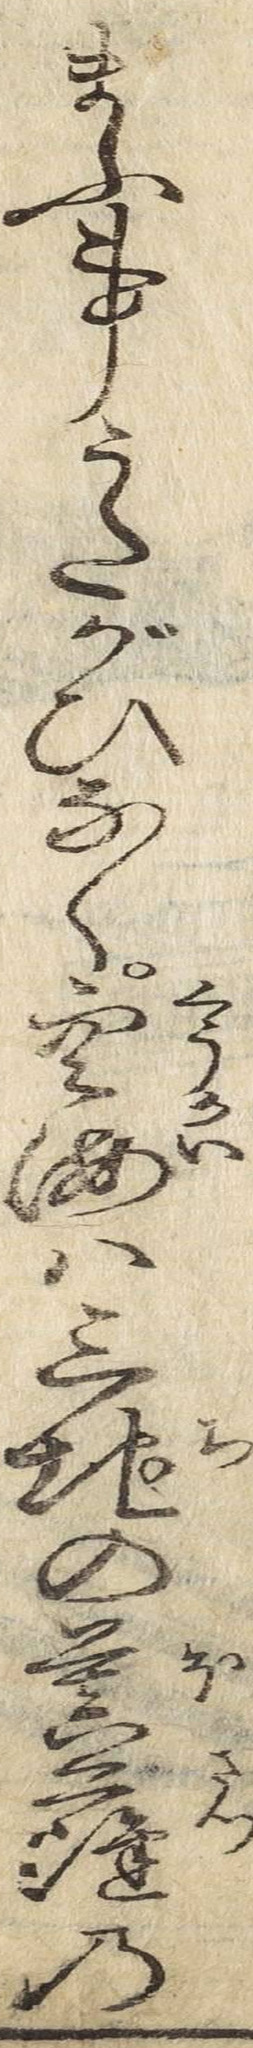まふ事うたがひなく。空海は三地の菩薩の
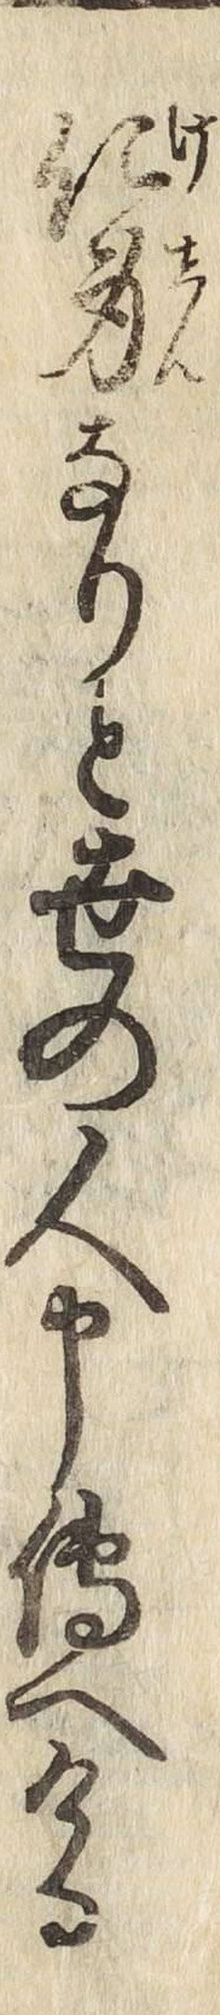化身なりと世の人申伝へける
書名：弘法大師御傳記
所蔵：京都府立京都学・歴彩館 国文学研究資料館
